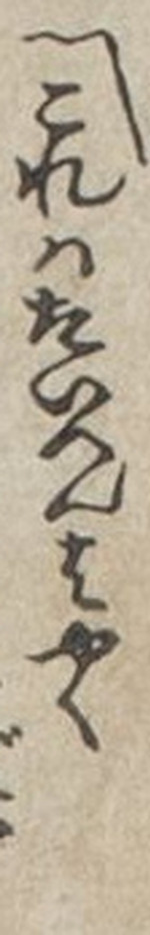〽これはたいへんはやく
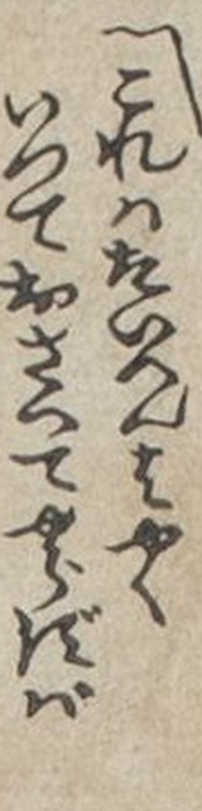いつておさへてやらずば
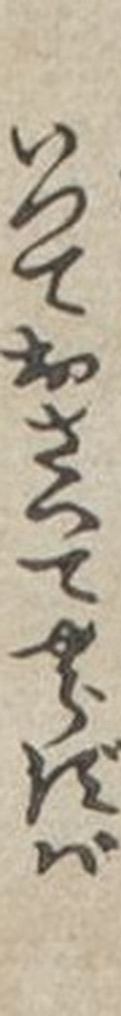いつておさへてやらずば
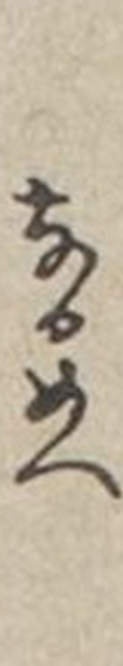なるめへ
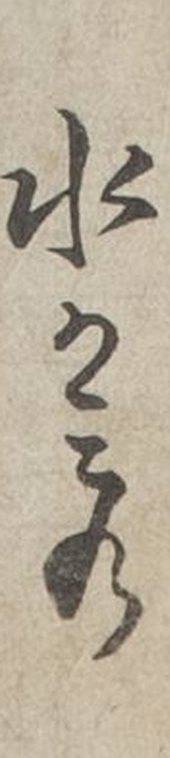水かみの
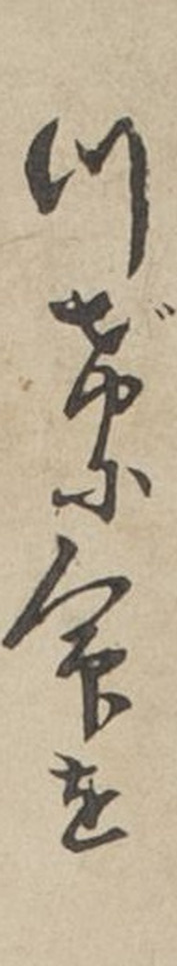つげに命を
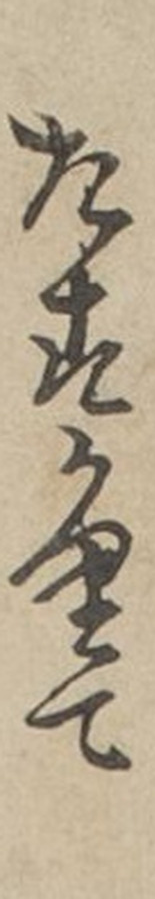たすかりて
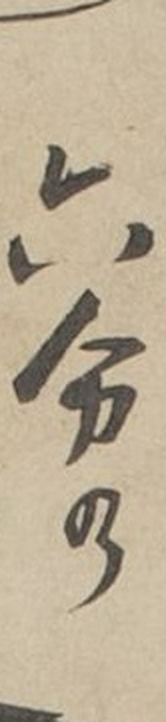六分の
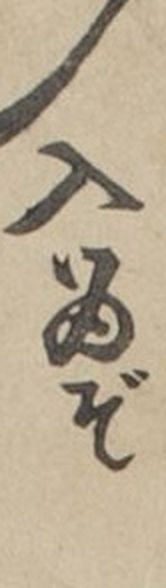入るぞ
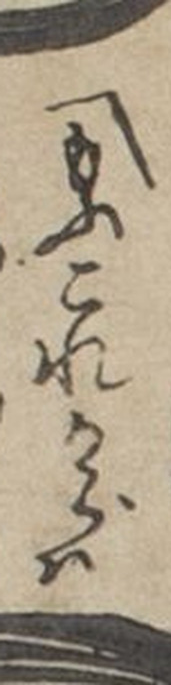〽もふこれからは
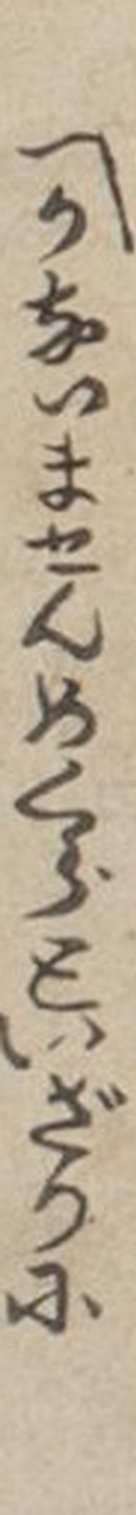〽かないませんめくらといざりに
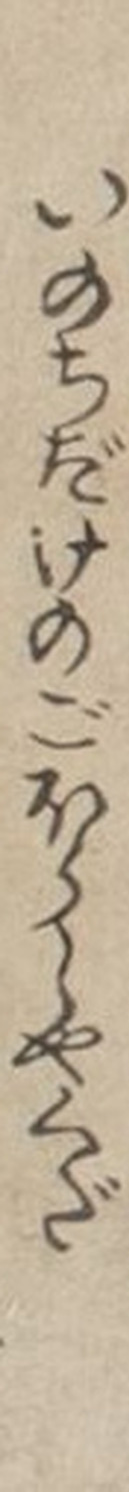いのちだけのごほうしやくだ
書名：江戸鯰と信州鯰
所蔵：あいおいニッセイ同和損保株式会社
